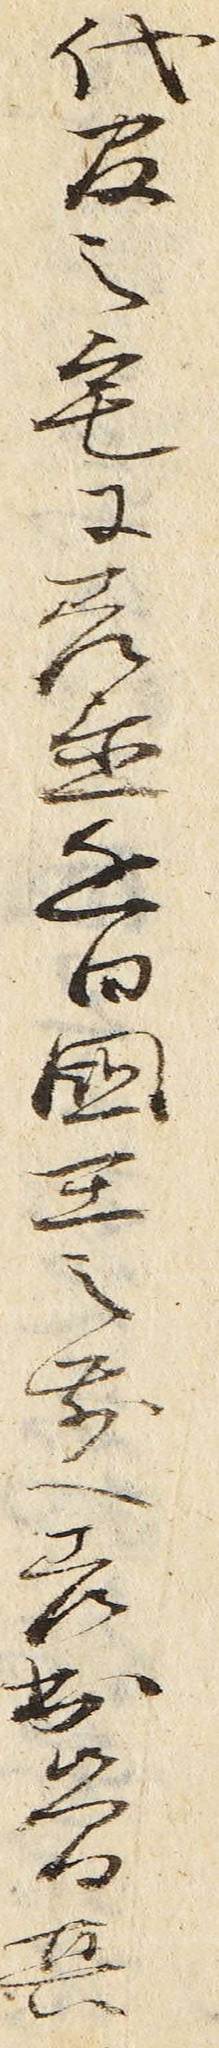代官之宅に差置近日国王之前へ差出候間其
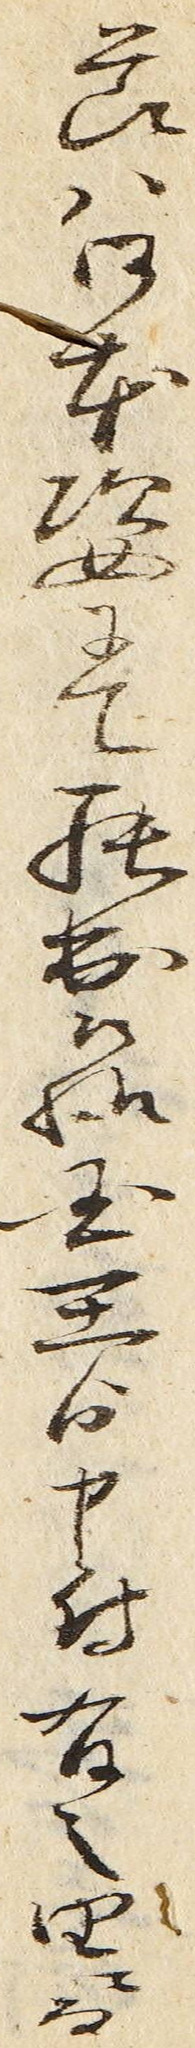節は日本姿にて罷出候様国王ゟ申付有之由にて
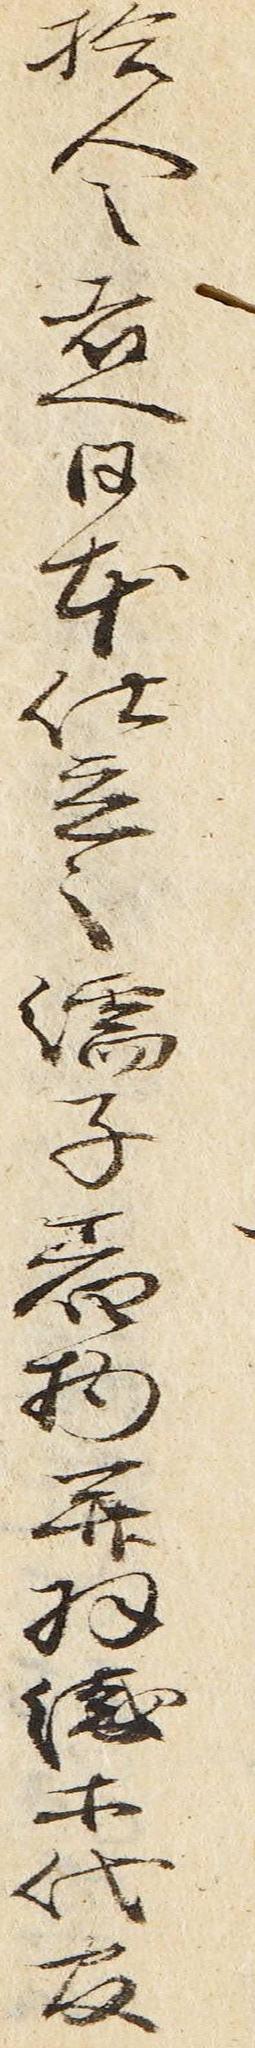拾人之者へ日本仕立之繻子着物并羽織等代官
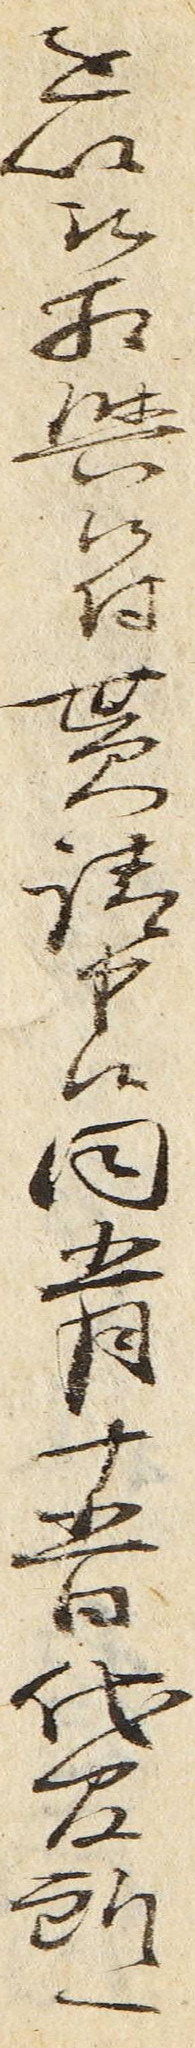を以被相与候付貰請申候同五月十五日代官所へ
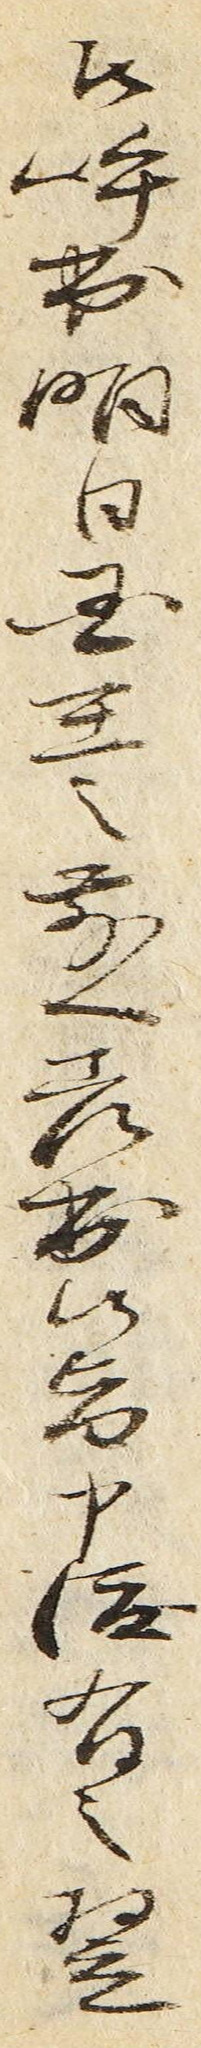被呼出明日国王之前へ差出候旨申渡有之翌
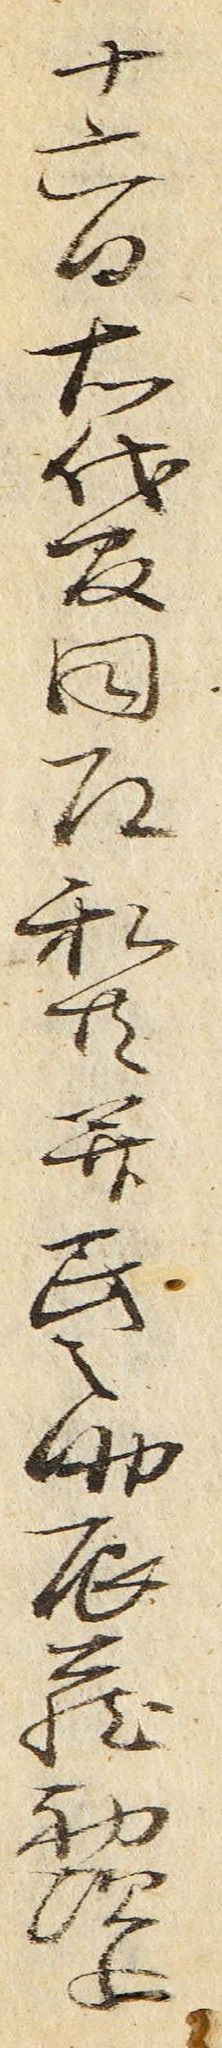十六日右代官同道私共并民之助辰蔵初次郎

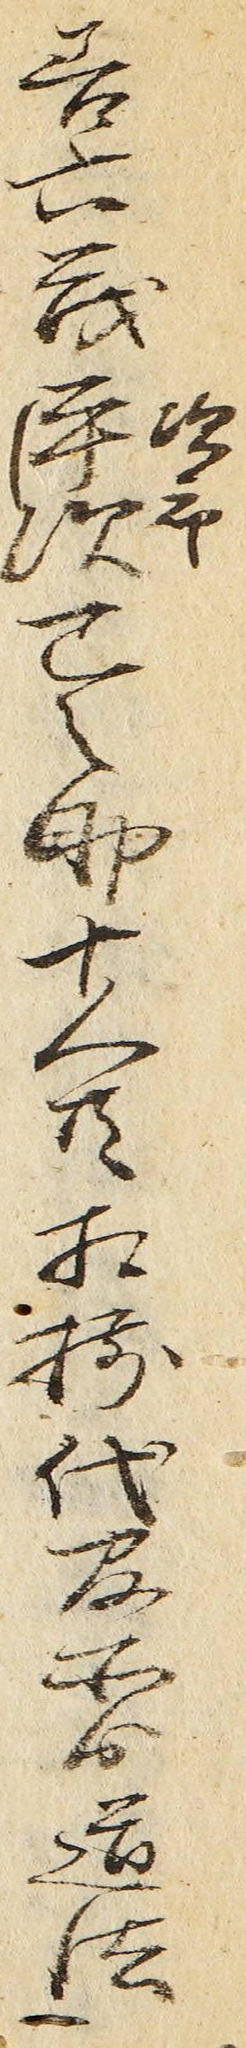善六茂平次巳之助十人共相揃代官所ゟ道法
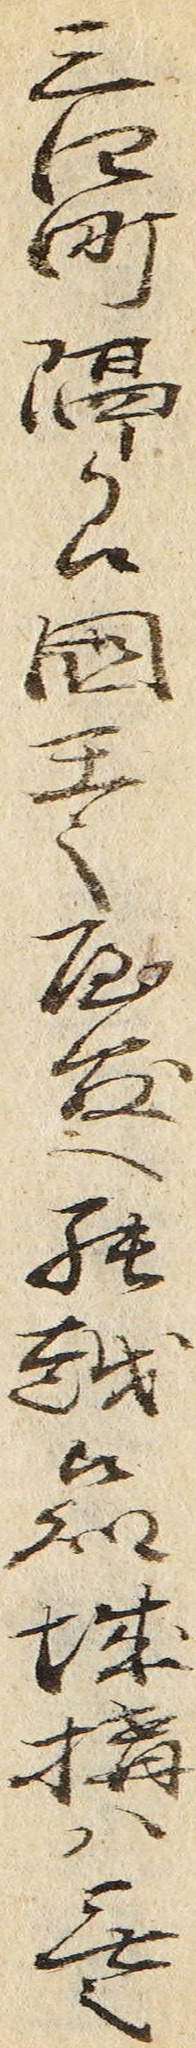三四町隔り候国王之屋敷へ罷越候処城構は無之
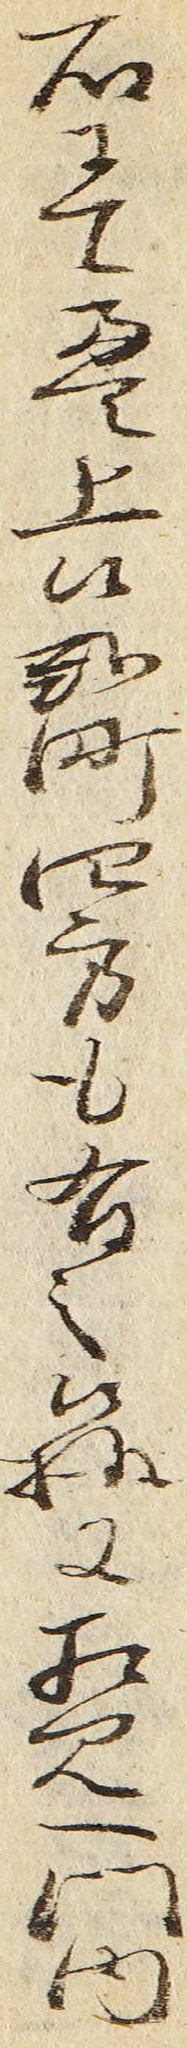石にて畳上候弐町四方も有之候様に相見へ門内
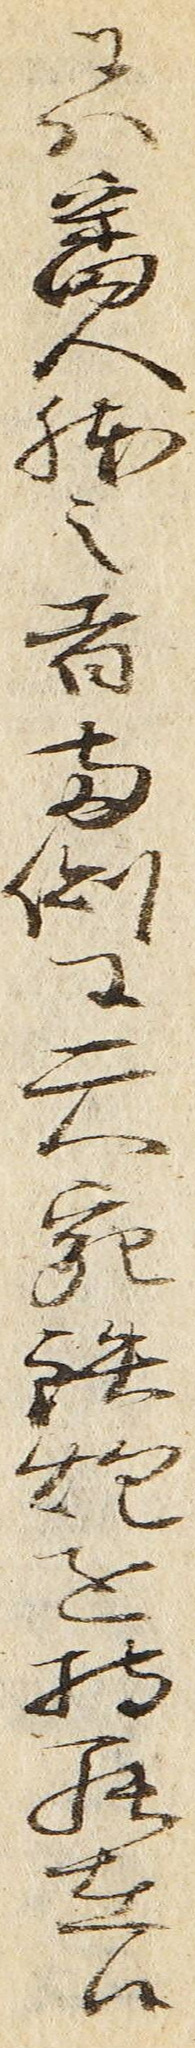には番人体之者両側に二人宛鉄炮を持罷在候
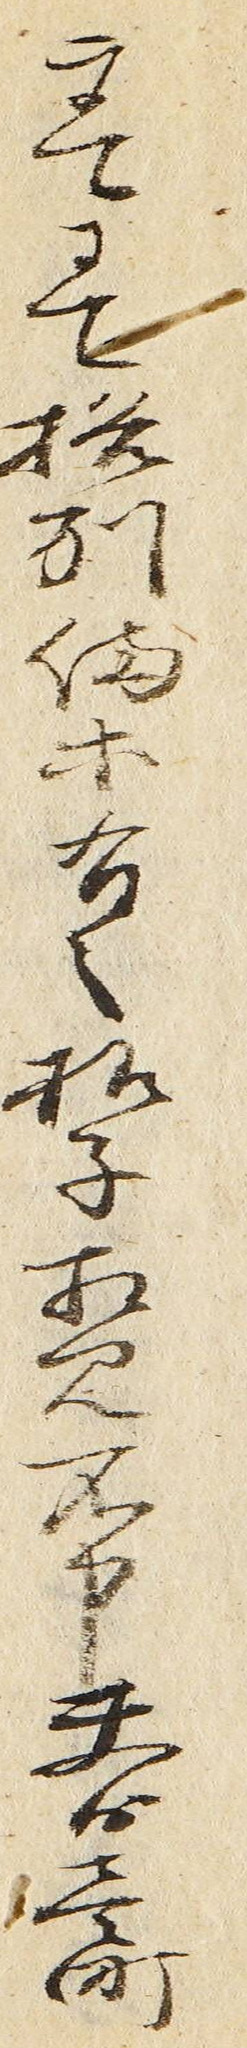まてにて格別備等有之様子相見不申夫ゟ壱町
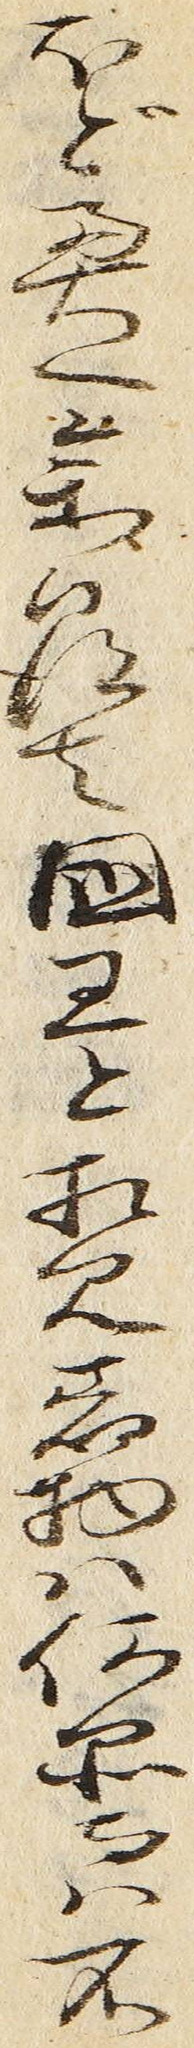ほど奥へ参候得は国王と相見着物は何品とは不
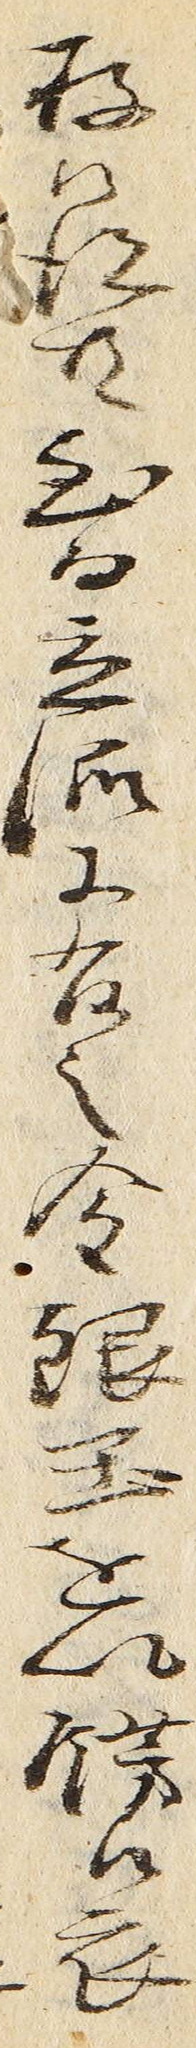存候得共至て立派に有之金銀玉を以餝候衣
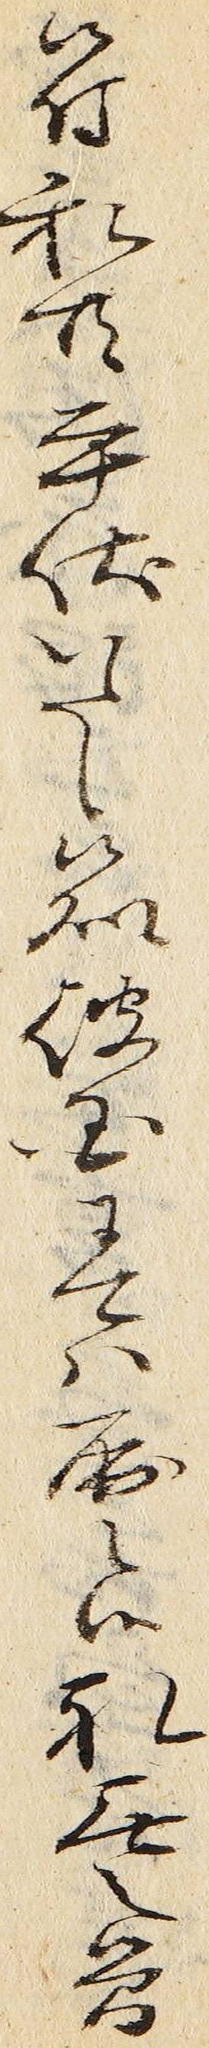候付私共平伏いたし候処彼国にては屈し候礼無之候間
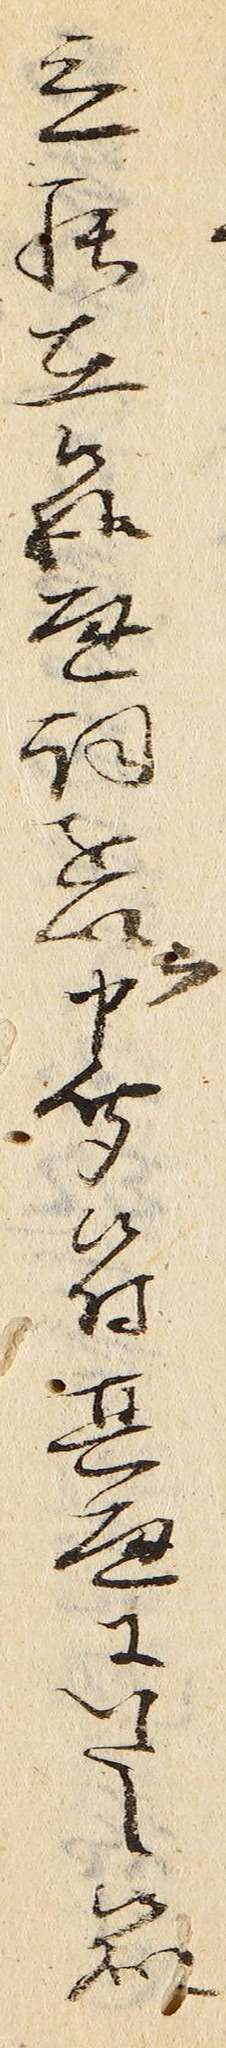立罷在候様通詞を以被申聞候付其通にいたし候処
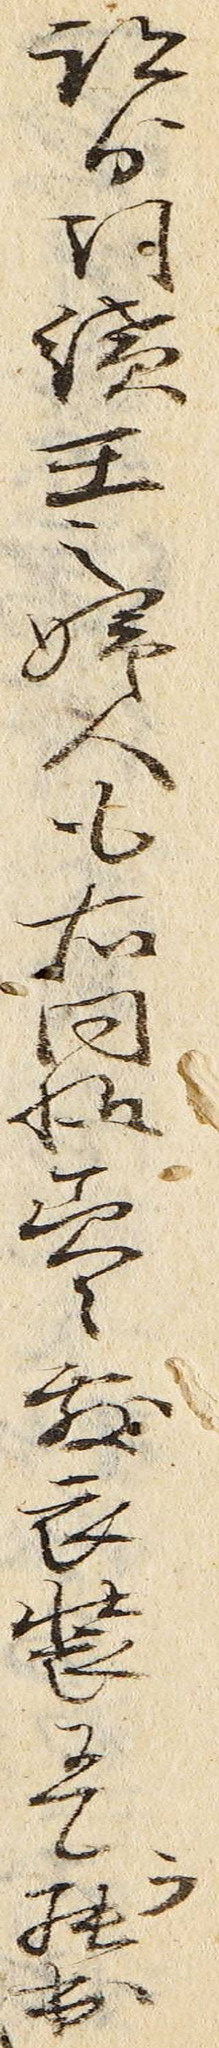跡ゟ引続王之婦人も右同様美々敷衣装にて被罷出
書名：漂民後記
